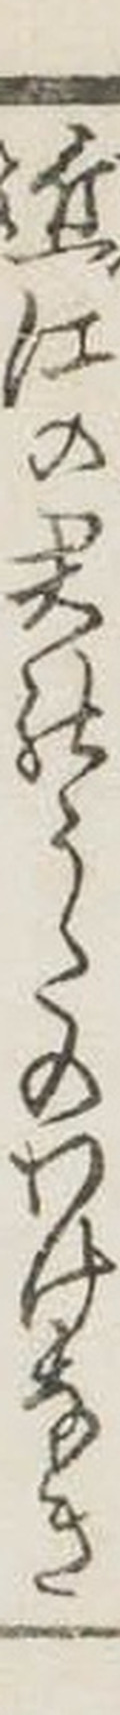近江の君のうたのわけなき
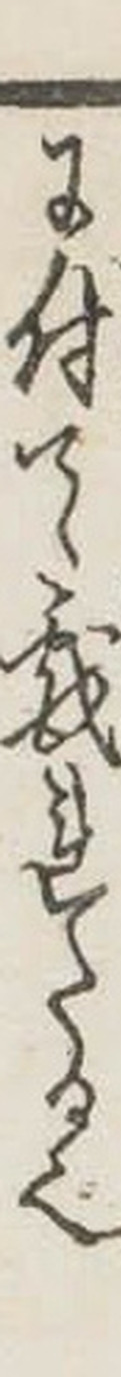に付て戯れたる也
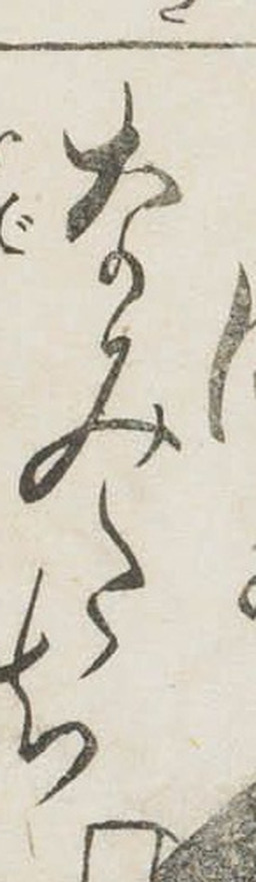なみたち
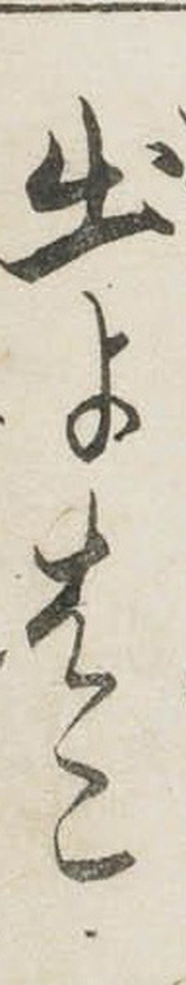出よはこ
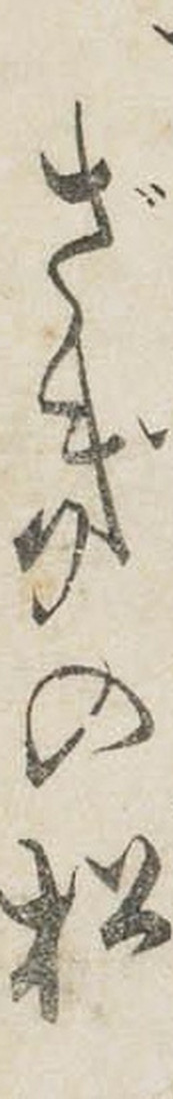ざきの松

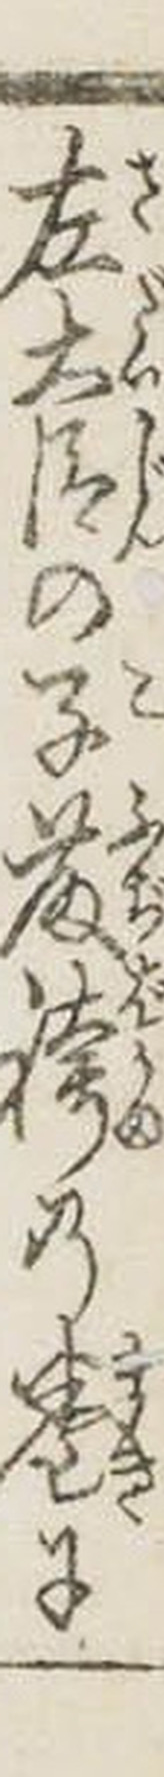左大臣の子藤袴の巻に
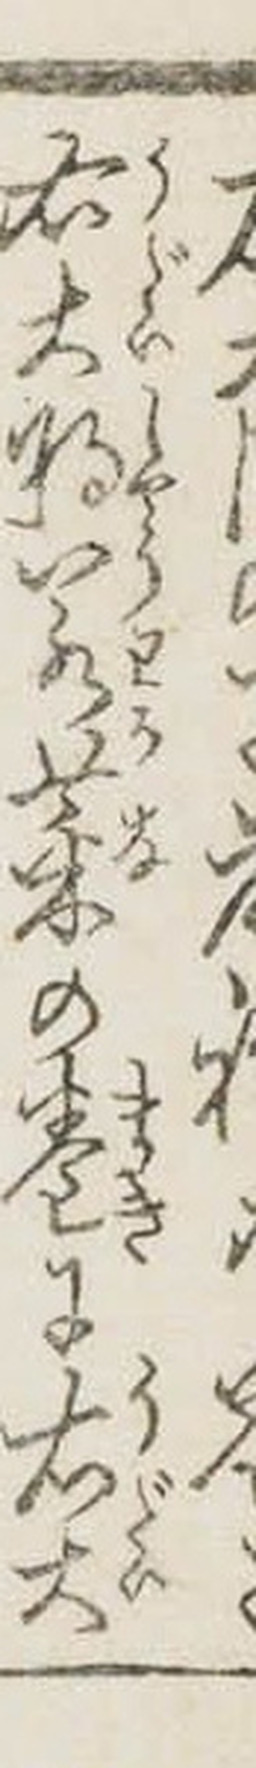右大将若菜の巻に右大
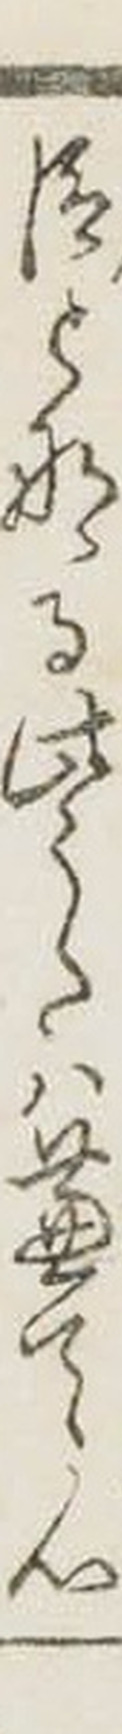臣となる此うたは兼て心
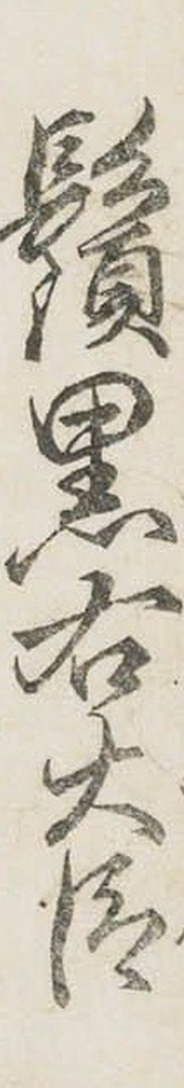鬚黒右大臣
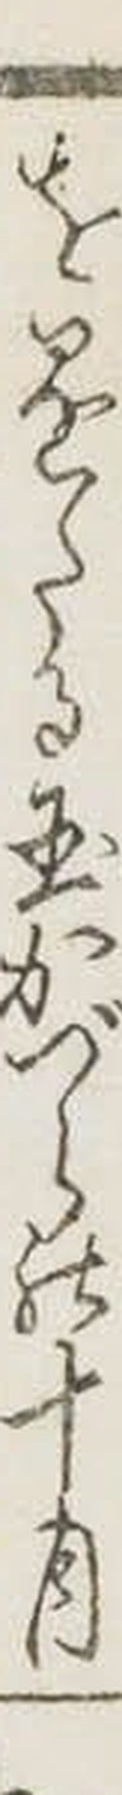を懸たる玉かづらの十月
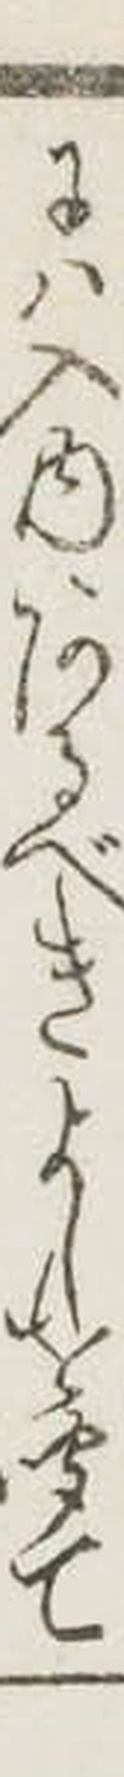には入内あるべきよしを聞て
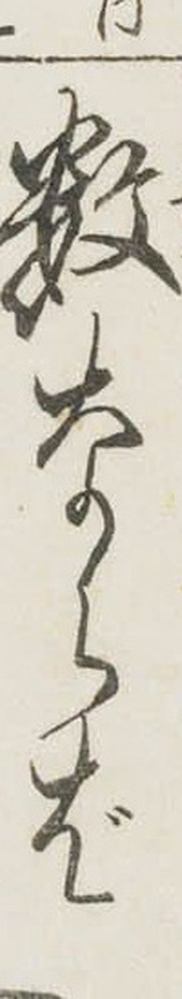数ならば
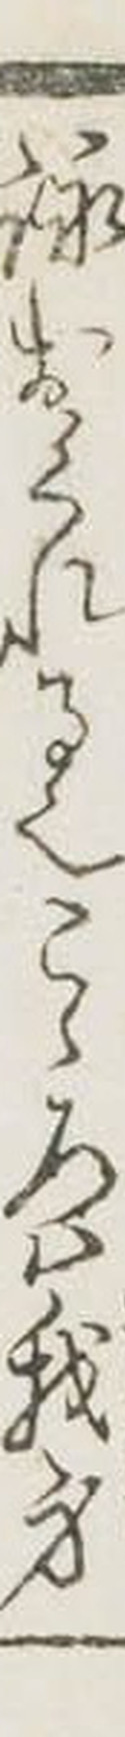詠おくれる也こゝろは我身
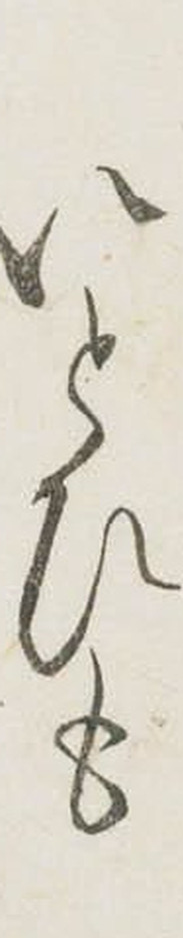いとひも
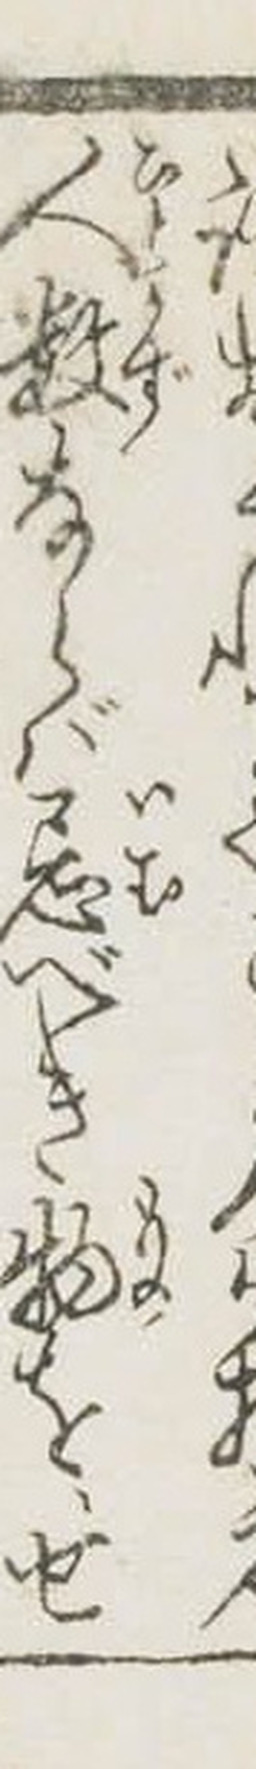人数ならば忌べき物をせ
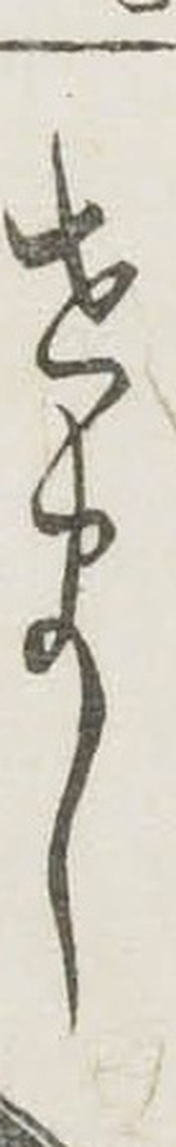せまし
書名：源氏百人一首
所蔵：東京学芸大学教育コンテンツアーカイブ
